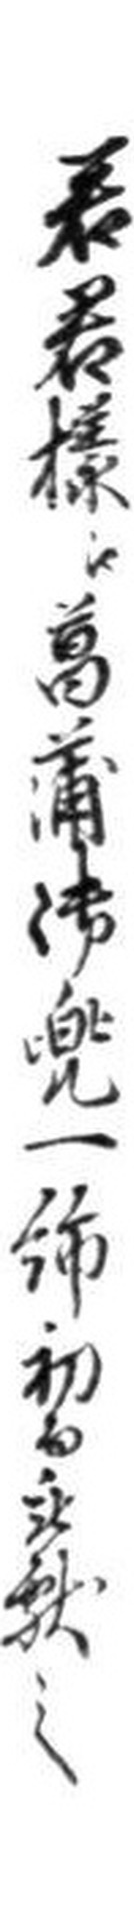若君様江菖蒲御兜一飾初而被献之
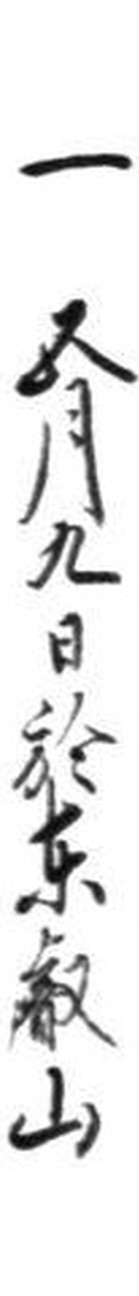一五月九日於東叡山
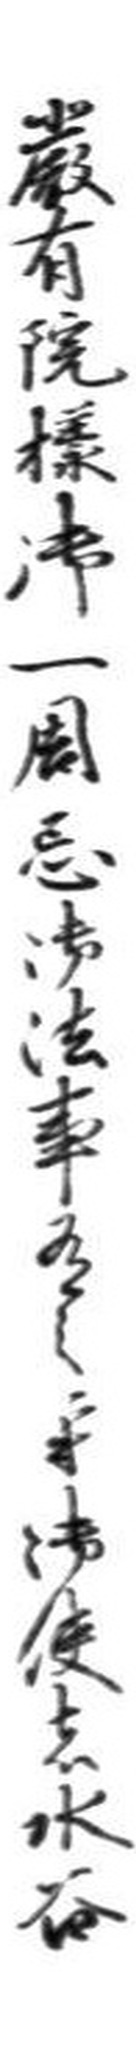厳有院様御一周忌御法事有之ニ付御使者水谷
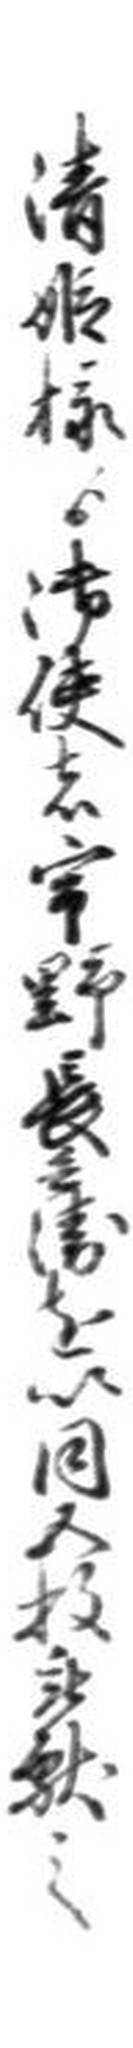清姫様ゟ御使者宇野長兵衛を以同五枚被献之
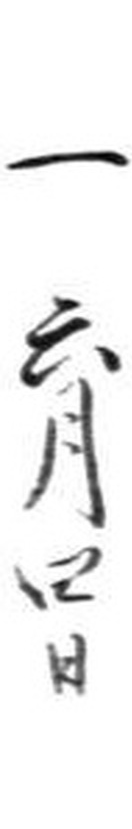一六月四日
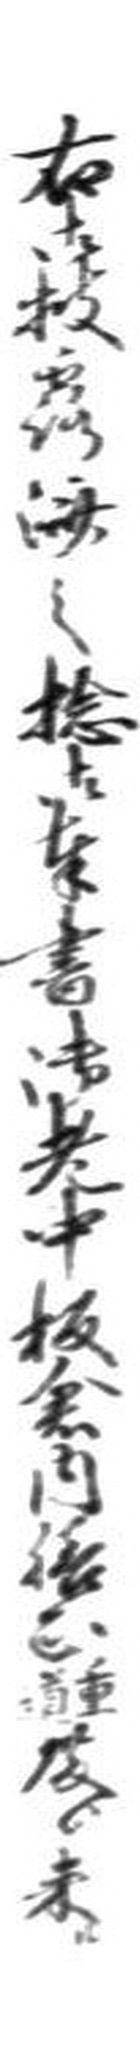右御披露済之捻御奉書御老中板倉内膳正重道殿ゟ来ル
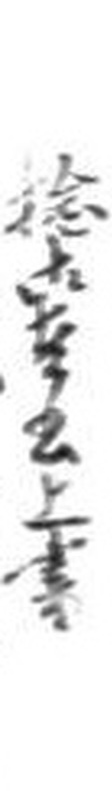捻御奉書上書
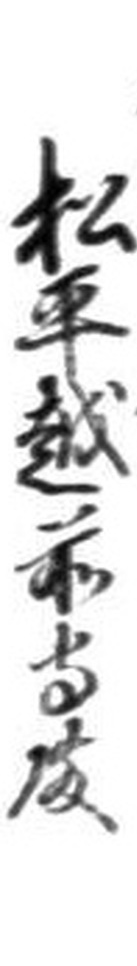松平越前守殿

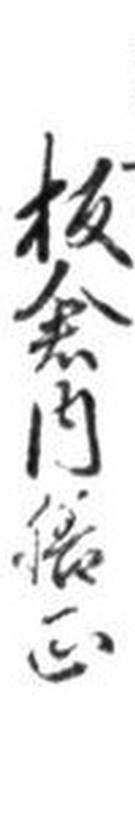板倉内膳正
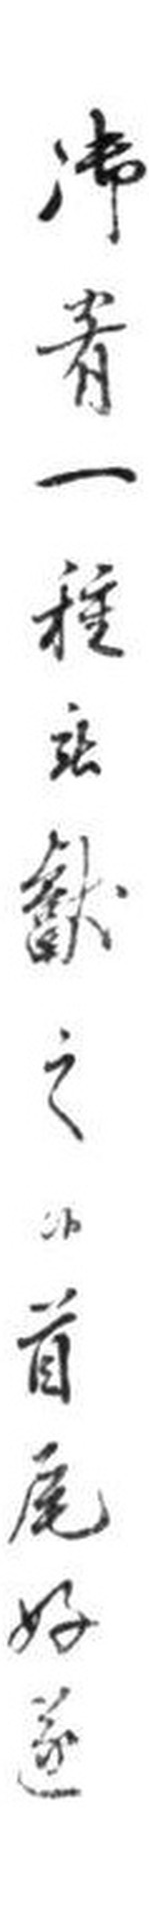御肴一種被献之候首尾好遂
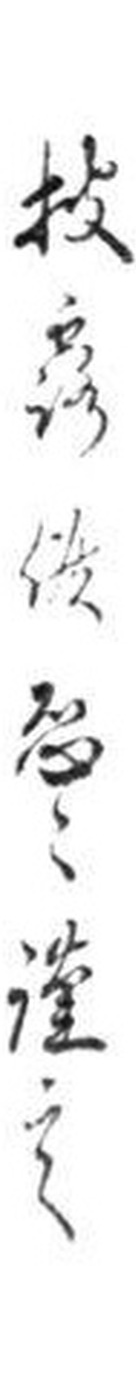披露候恐々謹言
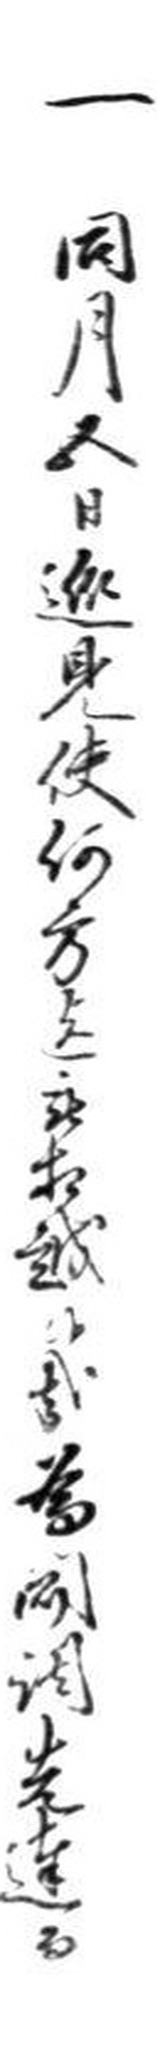一同月五日巡見使何方迄被相越候哉為聞調先達而
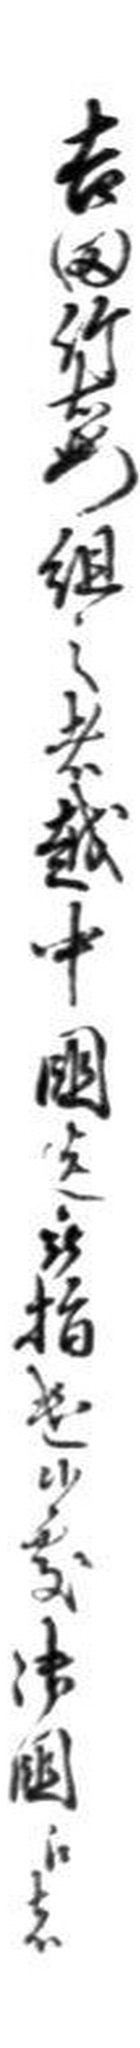吉田竹右衛門組之者越中国迄被指遣候処御国江者
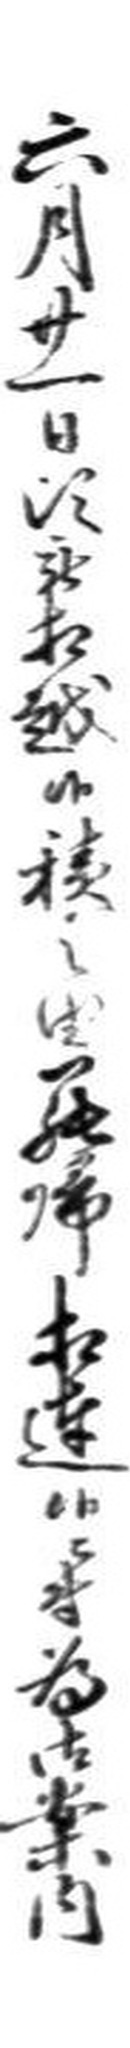六月廿一日頃被相越候積之由罷帰相達候ニ付為御案内
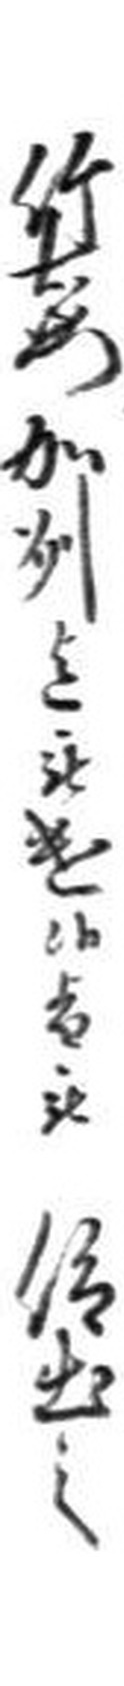竹右衛門加州迄被遣候旨被仰出之
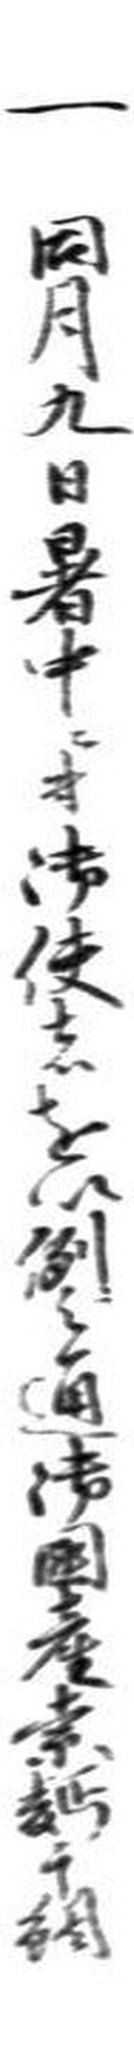一同月九日暑中ニ付御使者を以例之通御国産索麪干鯛
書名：家譜 十五 綱昌公 従天和元年到元禄十二年
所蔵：福井県文書館 Fukui Prefectural Archives
